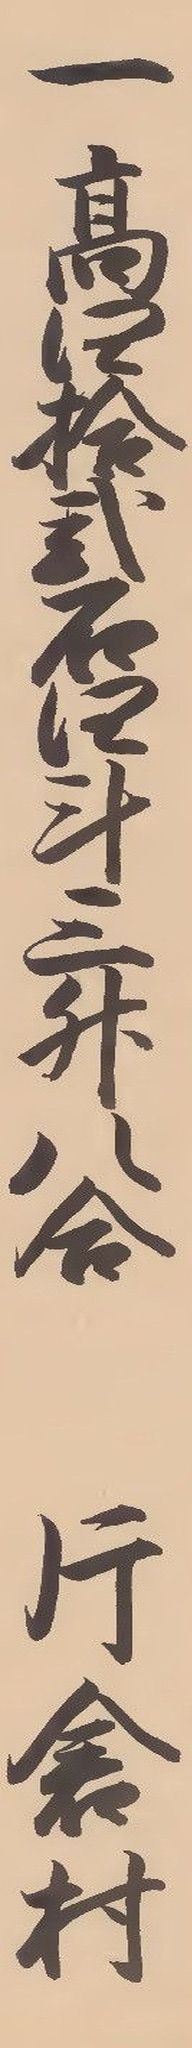一髙四拾弐石四斗三升八合片倉村
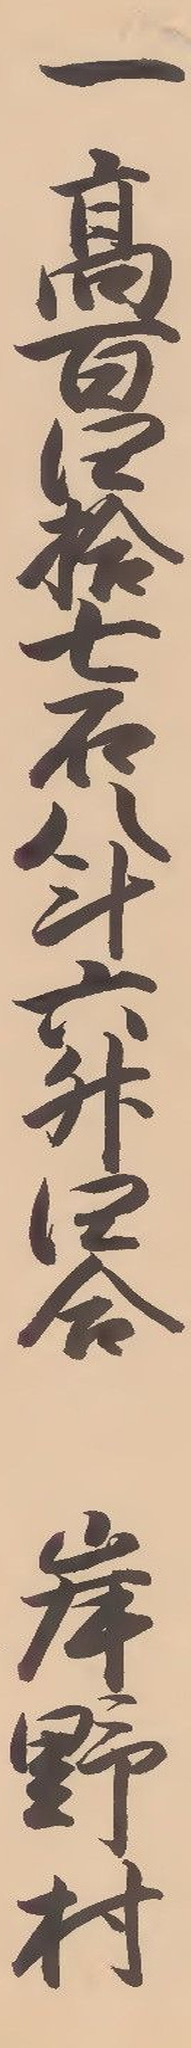一髙百四拾七石八斗六升四合岸野村
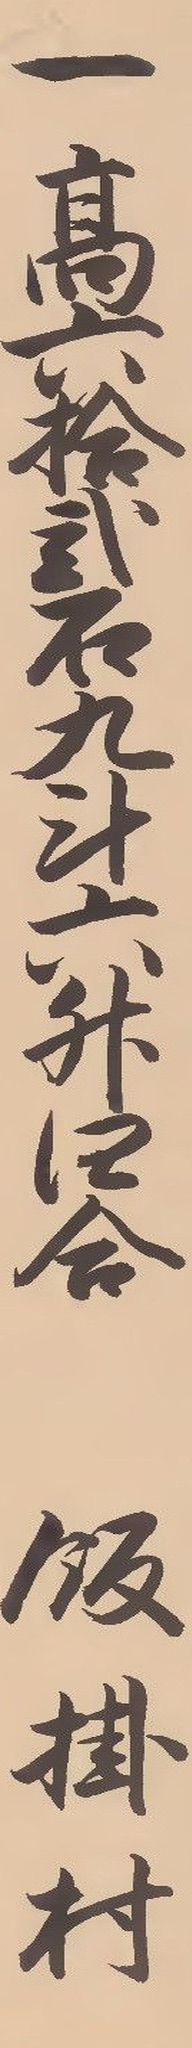一髙六拾弐石九斗六升四合飯掛村
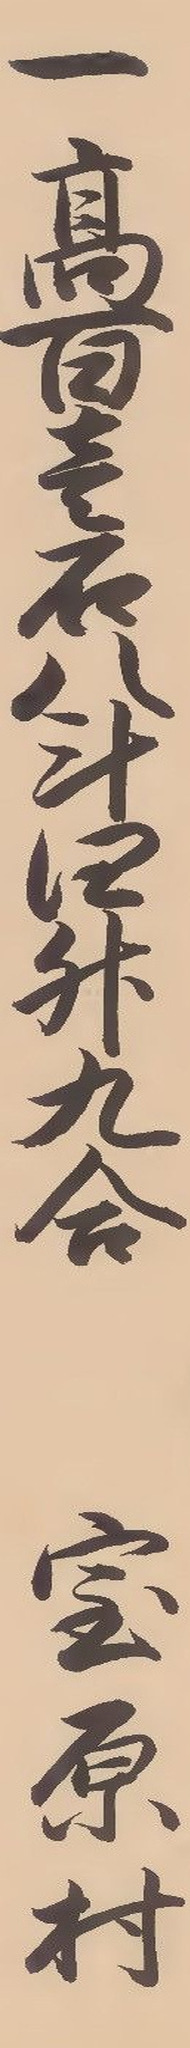一髙百壱石八斗四升九合室原村
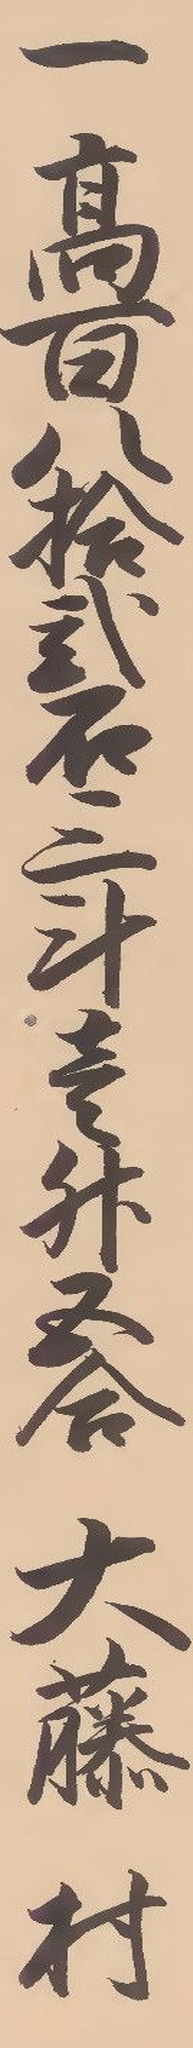一髙八拾弐石三斗壱升五合大藤村

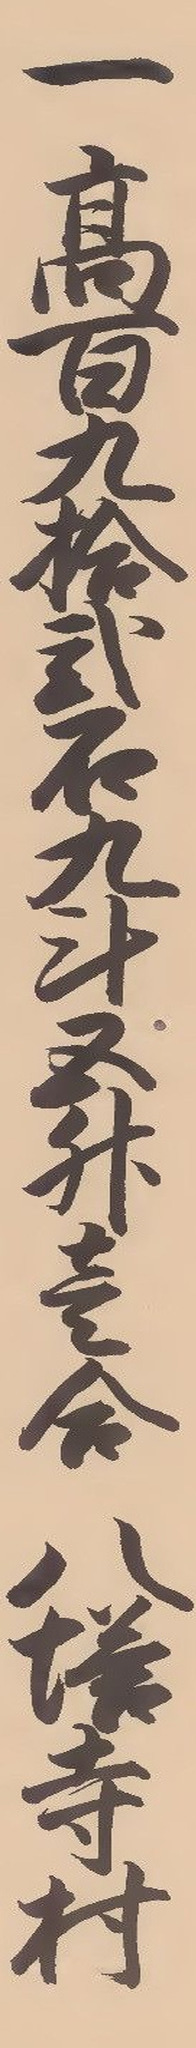一髙百九拾弐石九斗五升壱合八塔寺村
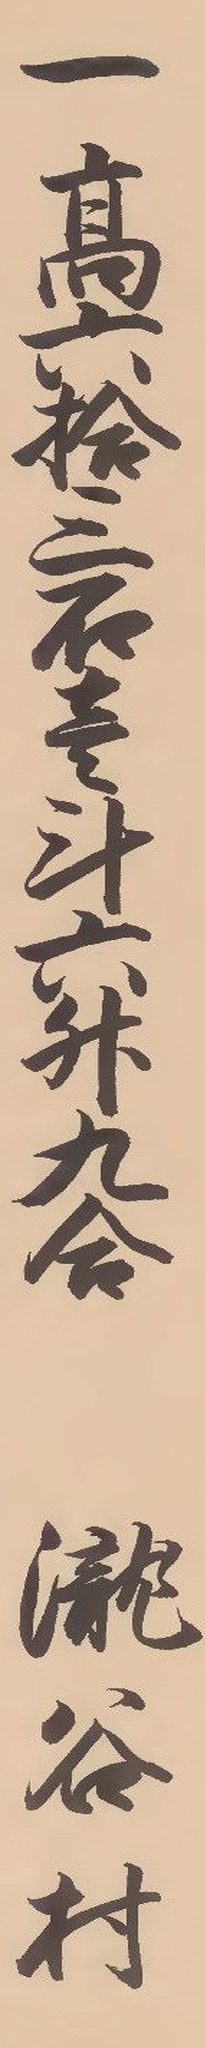一髙六拾三石壱斗六升九合瀧谷村
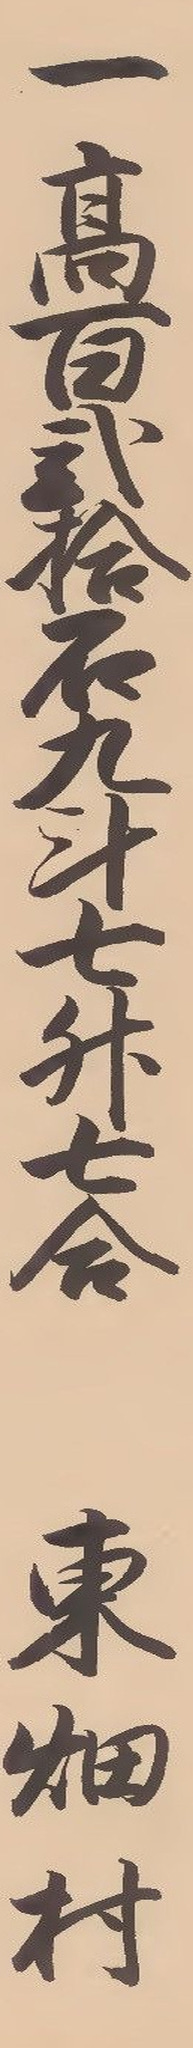一髙百弐拾石九斗七升七合東畑村
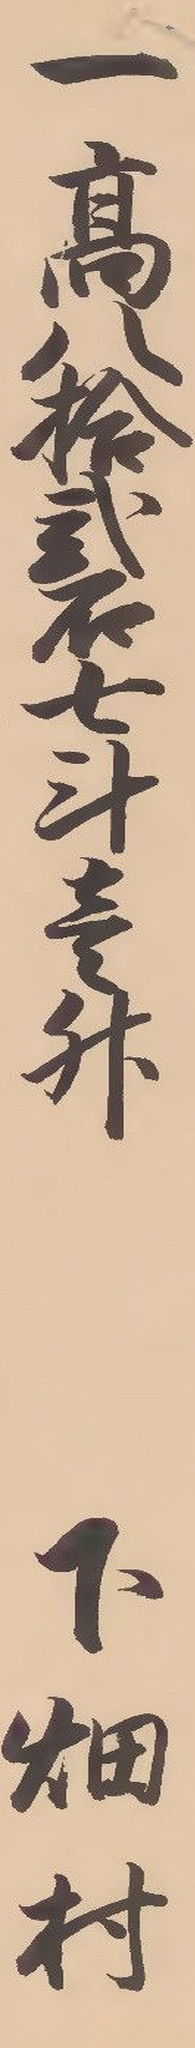一髙八拾弐石七斗壱升下畑村
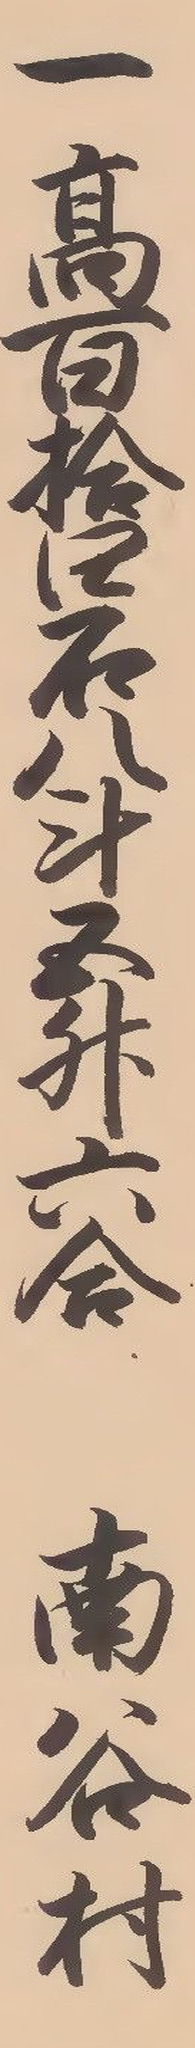一髙百拾四石八斗五升六合南谷村
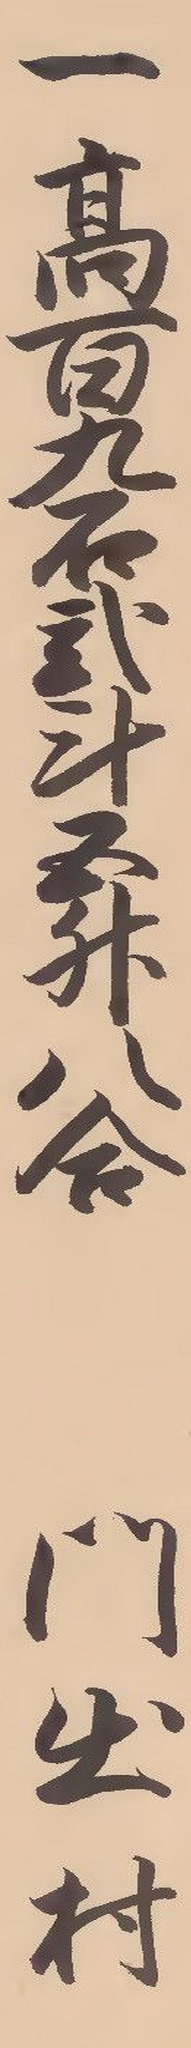一髙百九石弐斗五升八合門出村
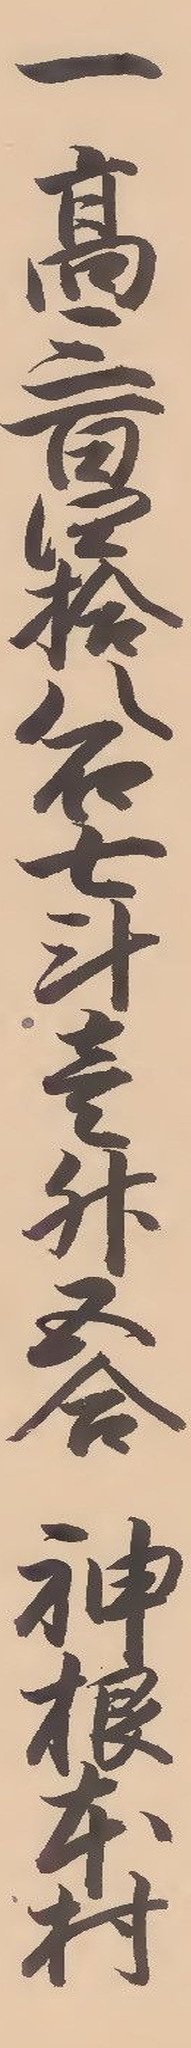一髙三百四拾八石七斗壱升五合神根本村

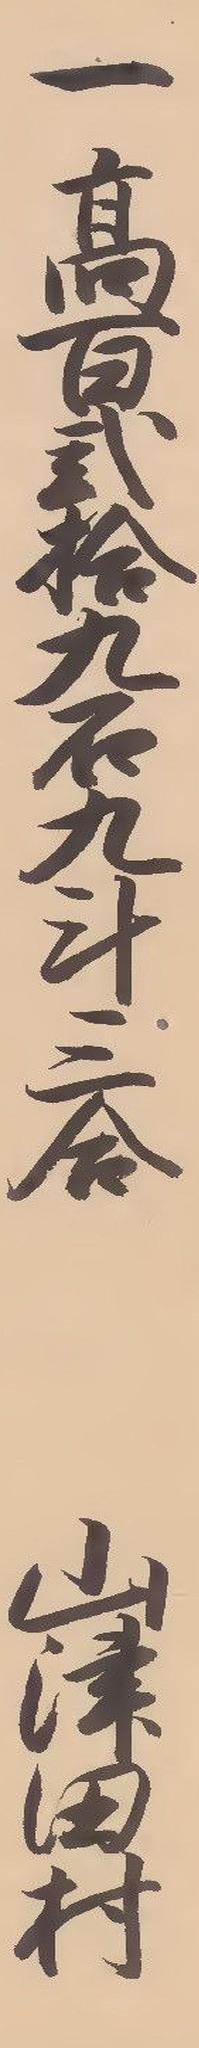一髙百弐拾九石九斗三合山津田村
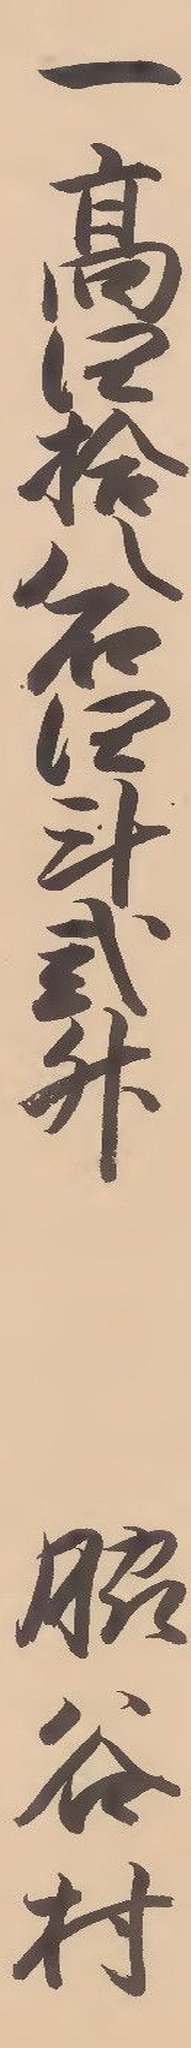一髙四拾八石四斗弐升脇谷村
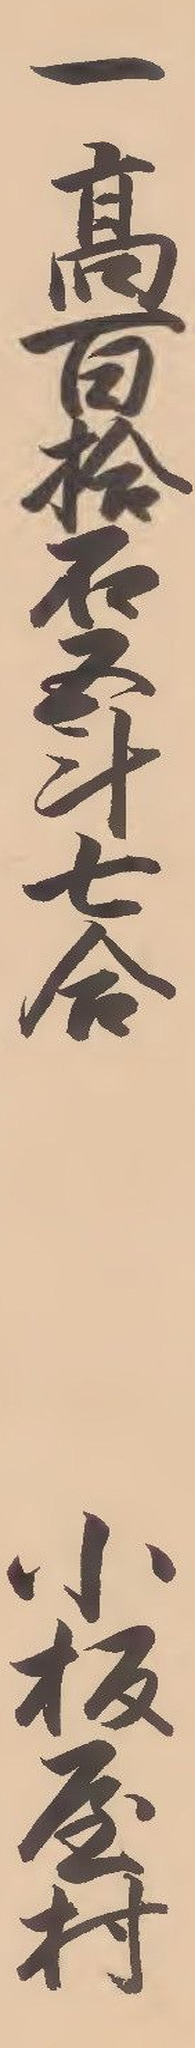一髙百拾石五斗七合小板屋村
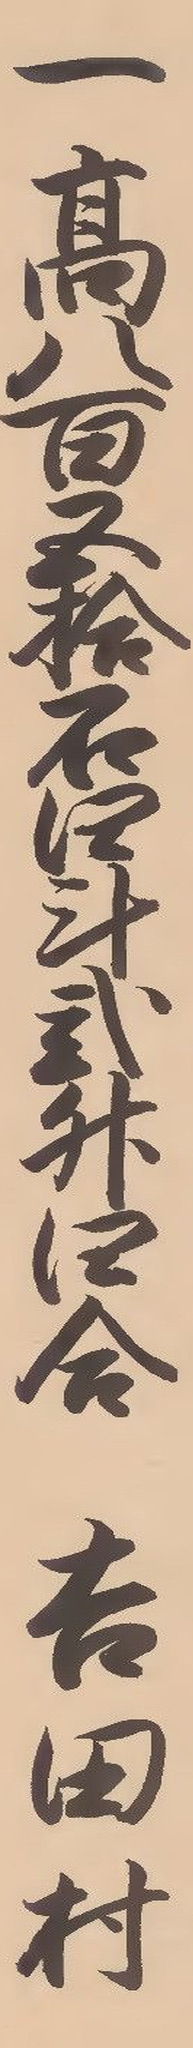一髙八百五拾石四斗弐升四合吉田村
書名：備前国郷帳
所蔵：国立公文書館 National Archives of Japan
